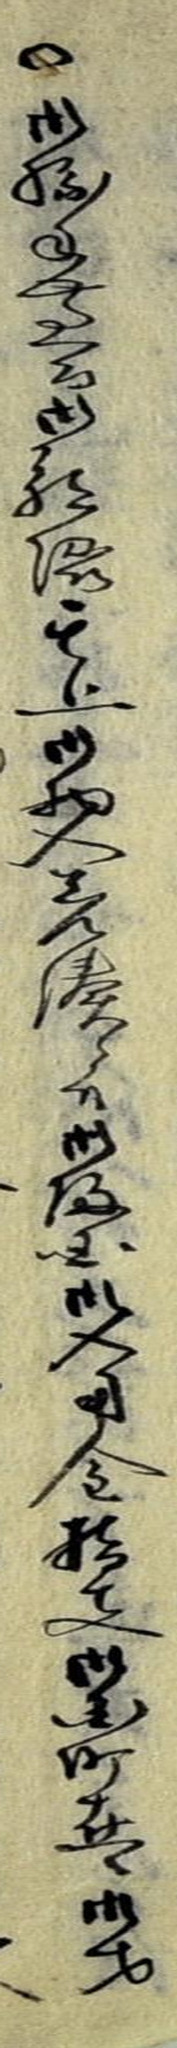〇御勝手兼而御難渋其上御物入差湊候に付御帰国御入用金指支御国町在へ御才
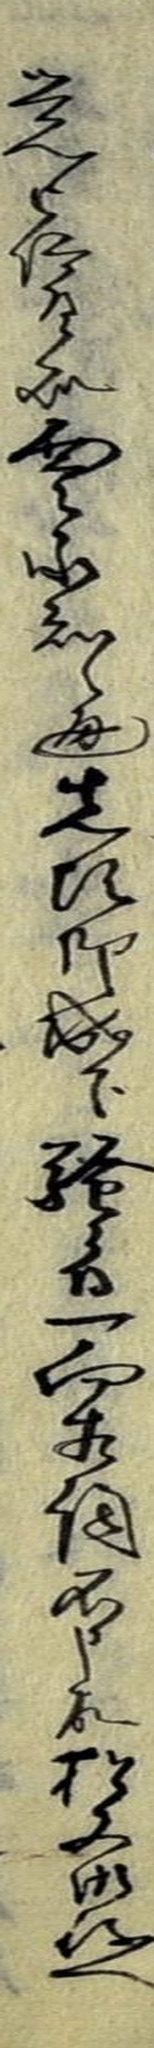覚被仰付候処面々承知之通先頃御城下騒に付一向相調不申故猶又御役人
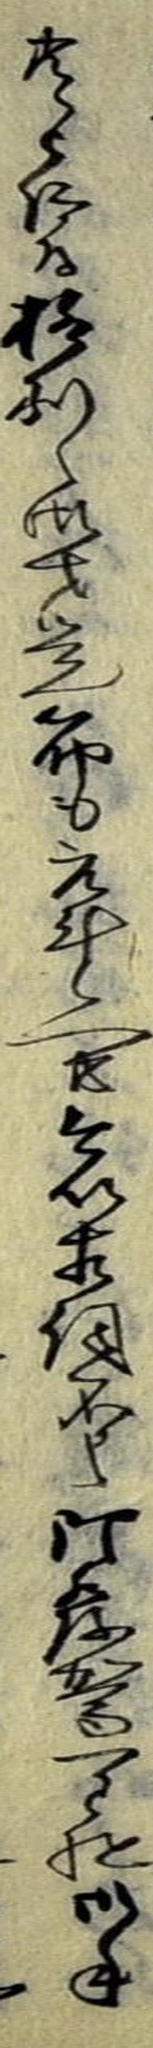共へ被仰付格別之御才覚筋も取斗候へ共今以相調不申御発駕可被遊御手
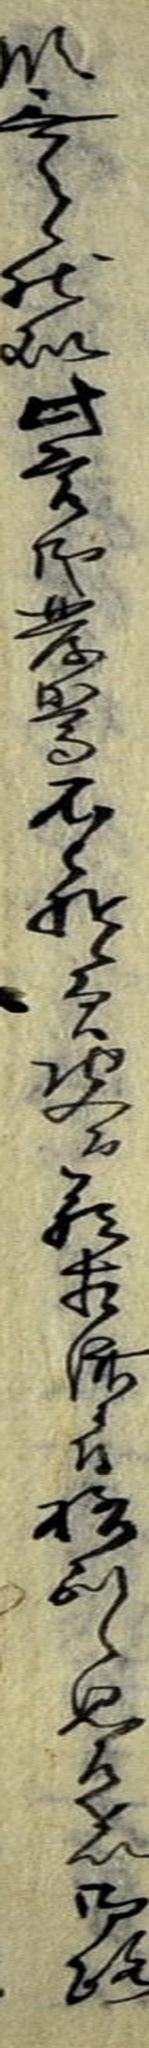段無之候然処此節御発駕不被遊候而は決而難相済に付格別之思召を以御路
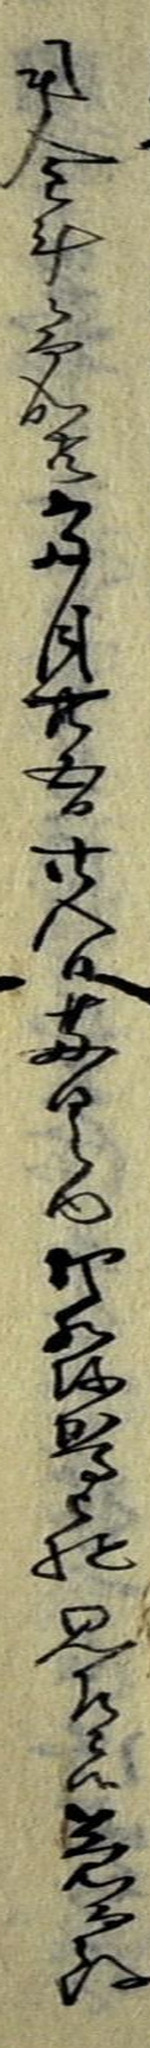用金斗に而成共当月廿五日廿八日両日之内御発駕被遊思召に候兼而致

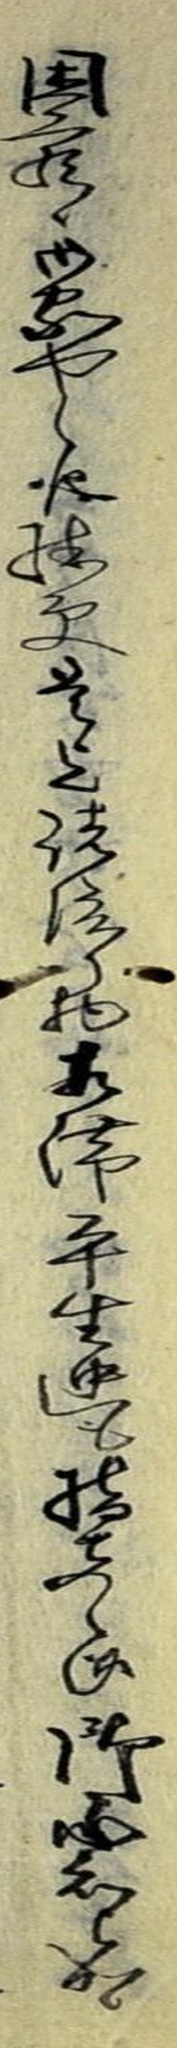困窮候御家中之儀殊更是迄諸渡り物相滞平生迚も差支之趣御承知被成候
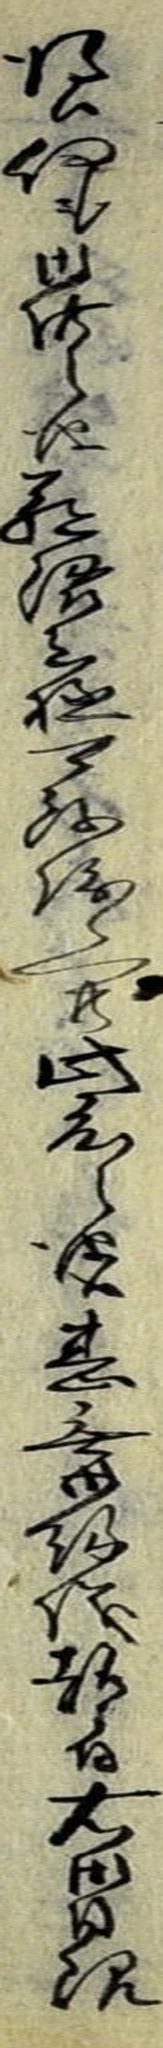得は何も御供之儀難渋至極可致儀候へ共此度之儀は甚無御余儀趣に付右御日限
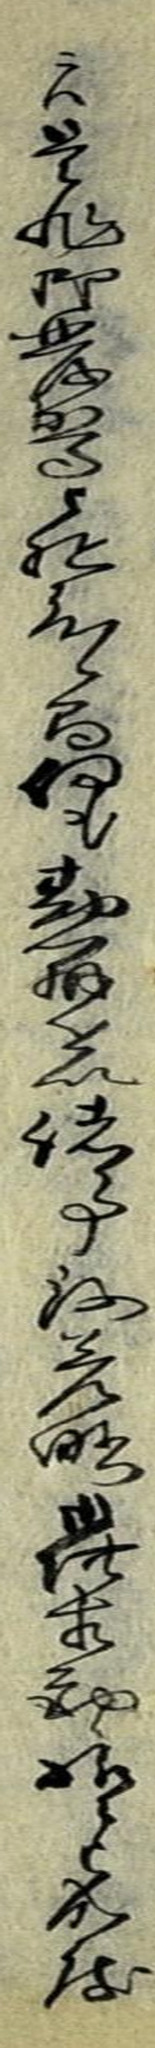には是非御発駕被遊度候間何も勘弁を以諸事致差略御供相勤候様被成度
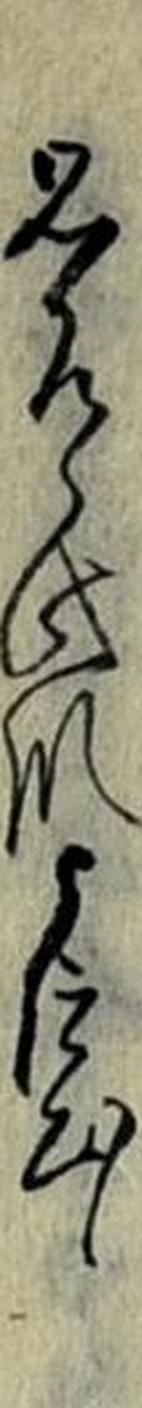思召此段被仰出候
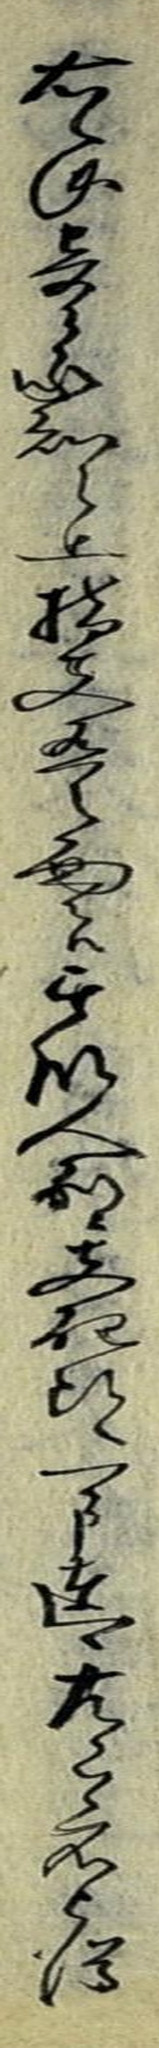右之趣寄々承知之上指支有之面々は其段人別に支配頭へ可申達候左候はゝ不被得
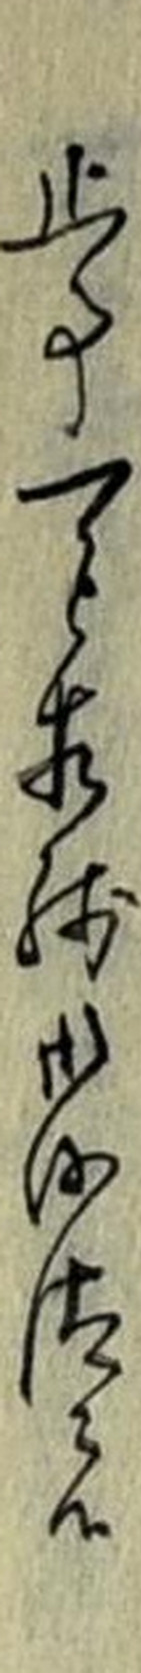止事可被相残御沙汰に候
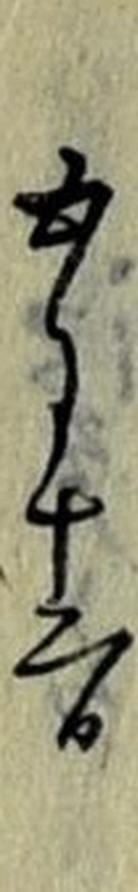五月十二日
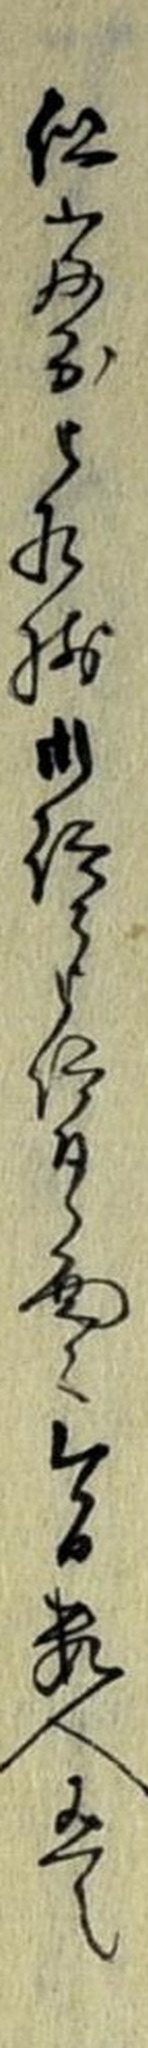但当分被相残御仰に被仰付候面々今日数人有之
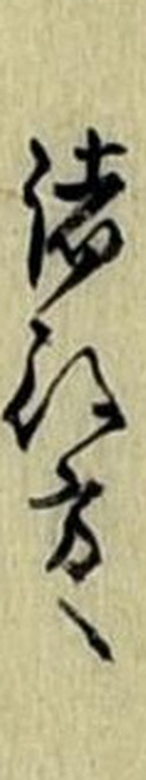諸役方へ
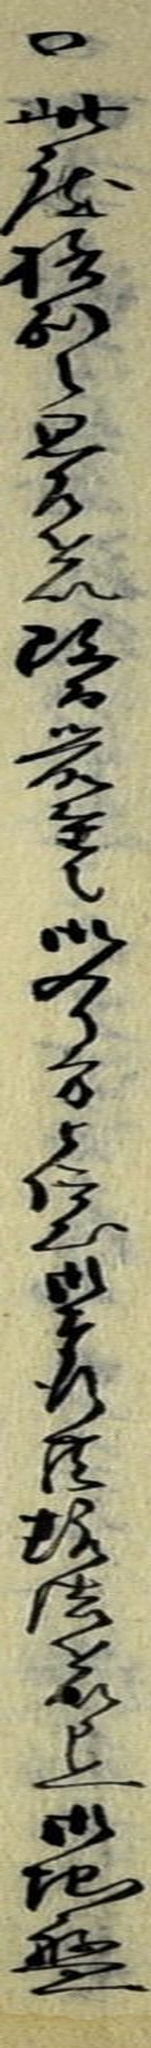〇此度格別之思召を以改而厳重之御〆り方被仰出御奉行共趣法を以申上御地盤
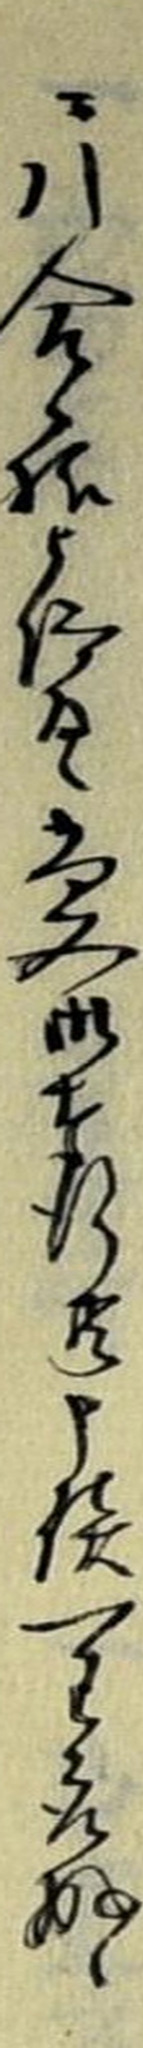に引合候様被仰付候尚又御奉行共申談可被取扱候
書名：命令之部 二
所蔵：福井県文書館 Fukui Prefectural Archives
